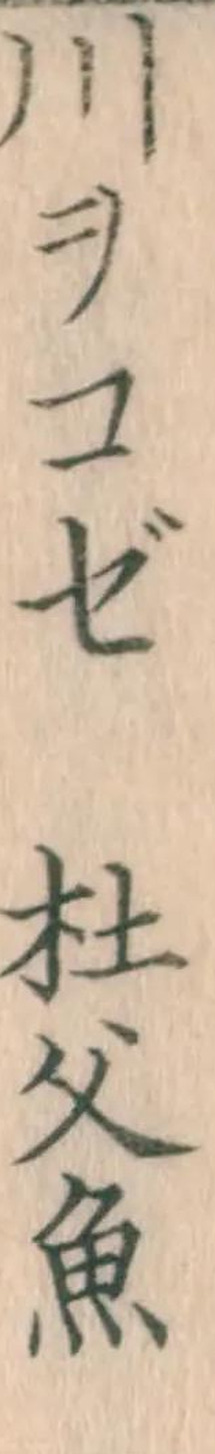川ヲコゼ杜父魚
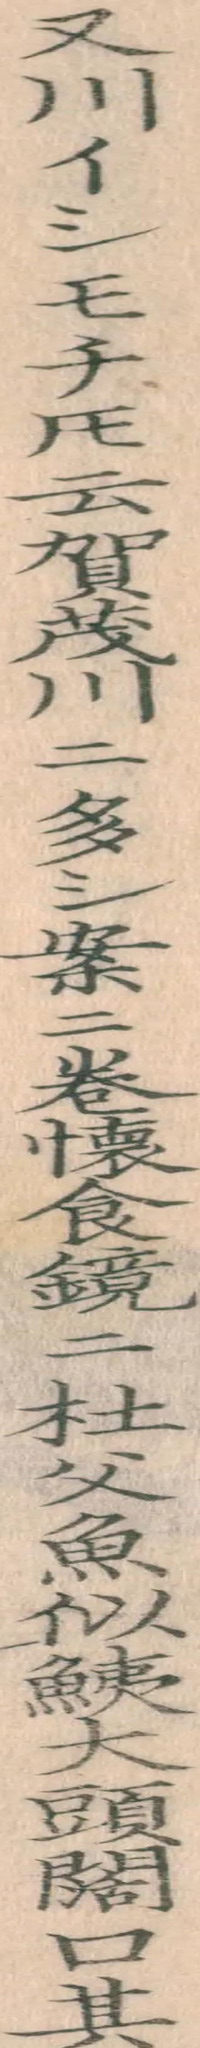又川イシモチトモ云賀茂川ニ多シ案ニ巻懐食鏡ニ杜父魚似鮧大頭闊口其
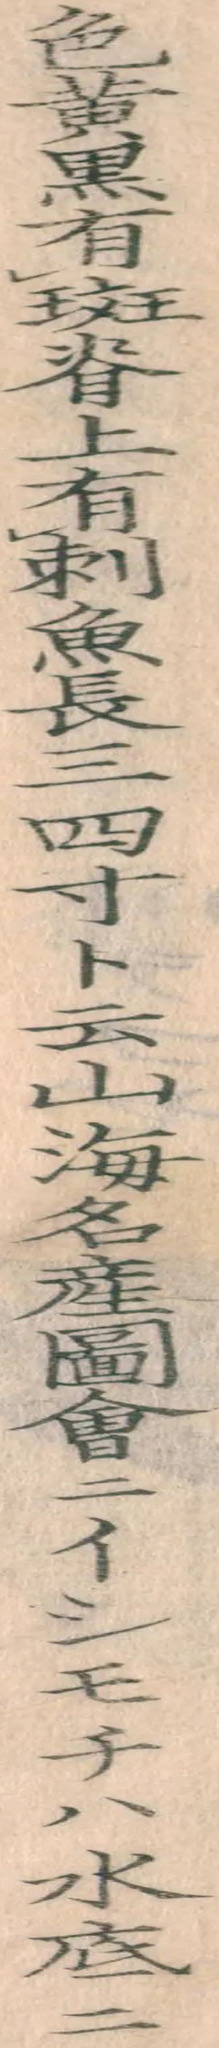色黄黒有斑脊上有刺魚長三四寸ト云山海名産図会ニイシモチハ水底ニ
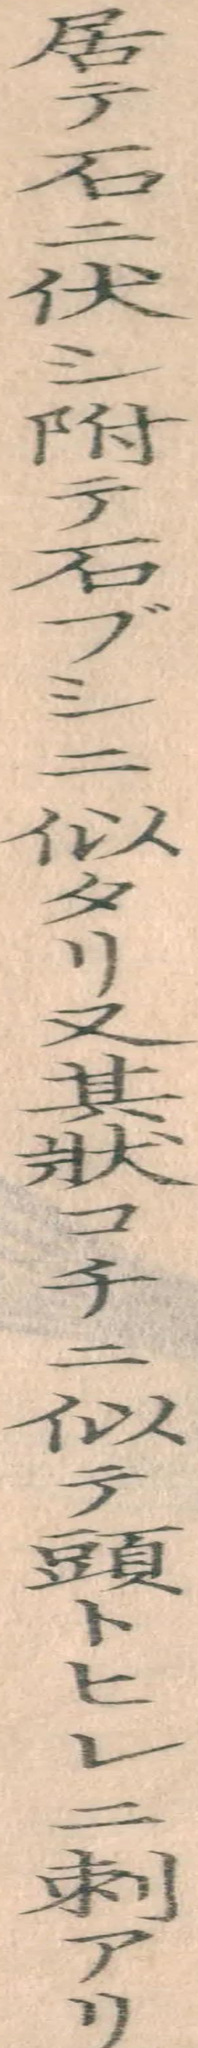居テ石ニ伏シ附テ石ブシニ似タリ又其状コチニ似テ頭トヒレニ刺アリ
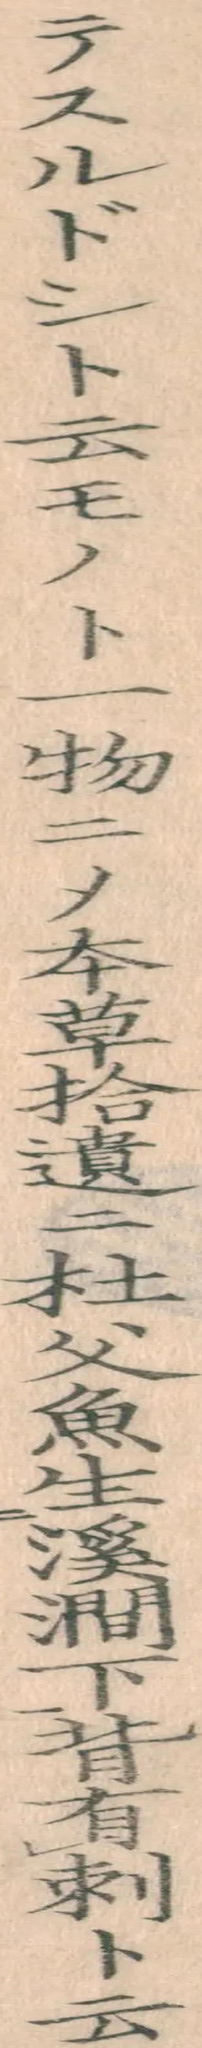テスルドシト云モノト一物ニシテ本草拾遺ニ杜父魚生渓澗下背有刺ト云
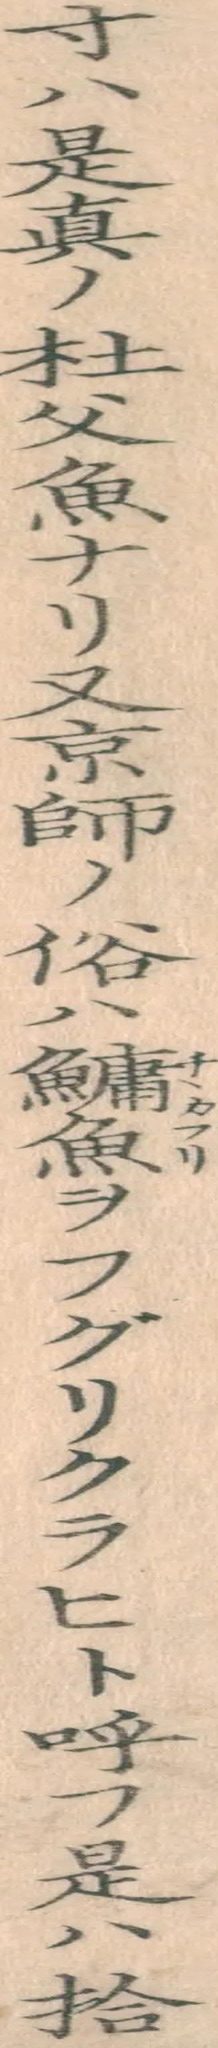寸ハ是真ノ杜父魚ナリ又京師ノ俗ハ鱅魚ヲフグリクラヒト呼フ是ハ拾
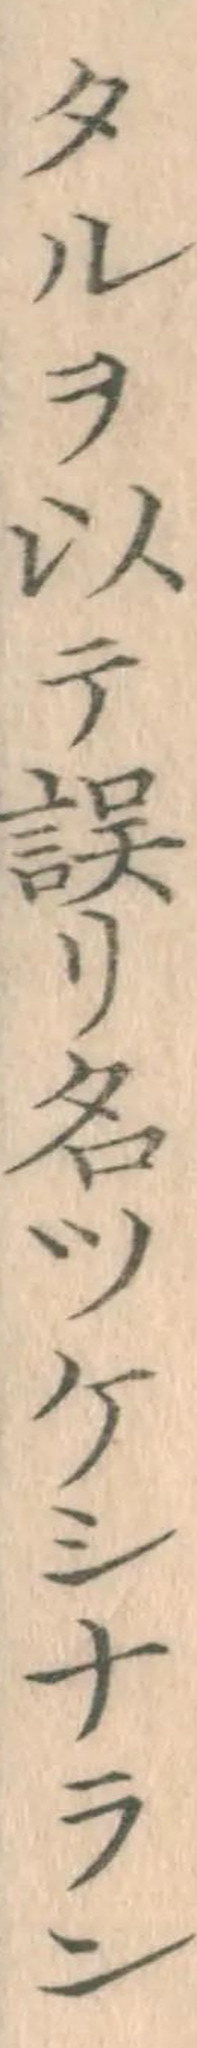タルヲ以テ誤リ名ツケシナラン

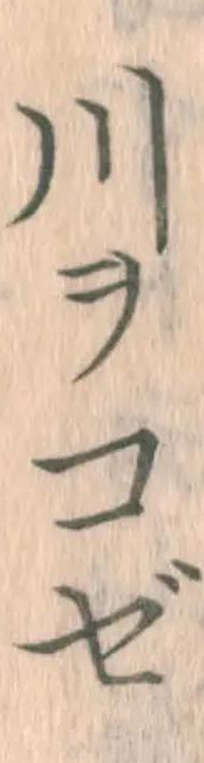川ヲコゼ
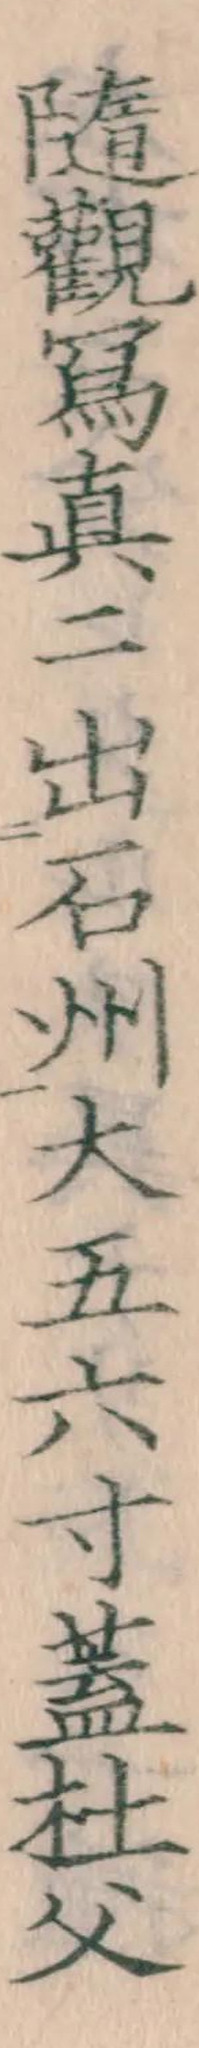随観写真ニ出石州大五六寸蓋杜父
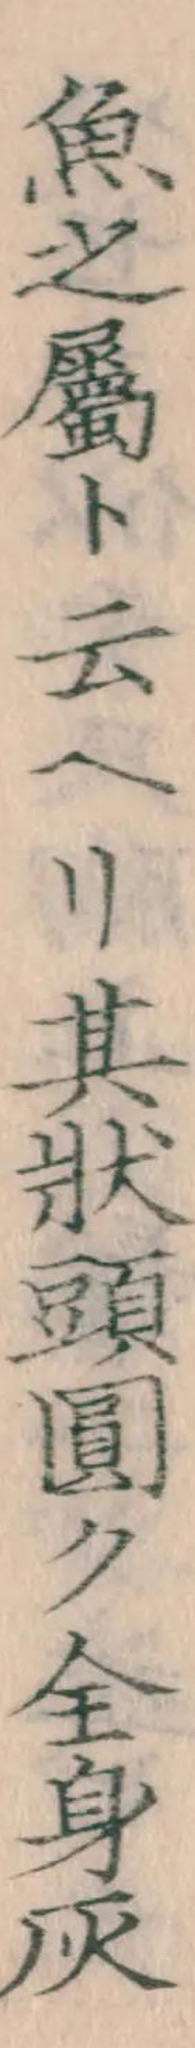魚之属ト云ヘリ其状頭円ク全身灰
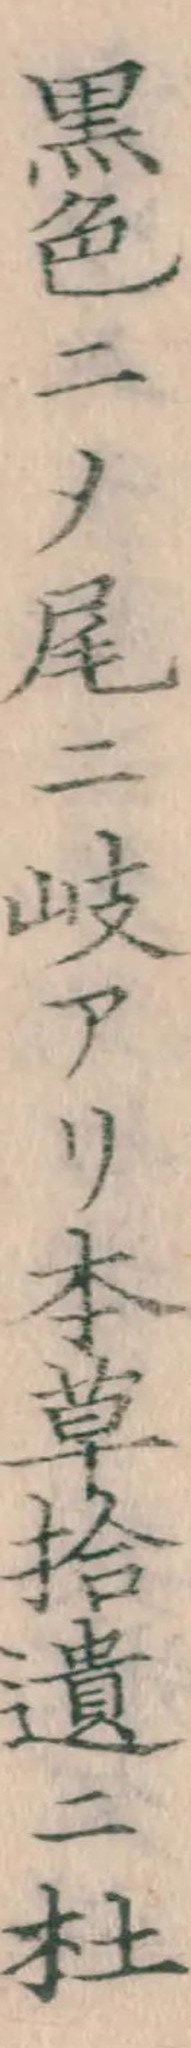黒色ニシテ尾ニ岐アリ本草拾遺ニ杜
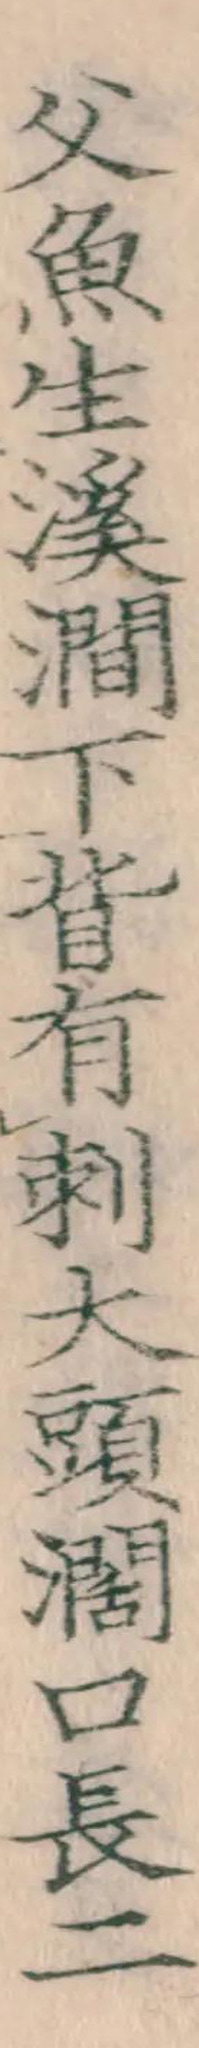父魚生渓澗下背有刺大頭濶口長二
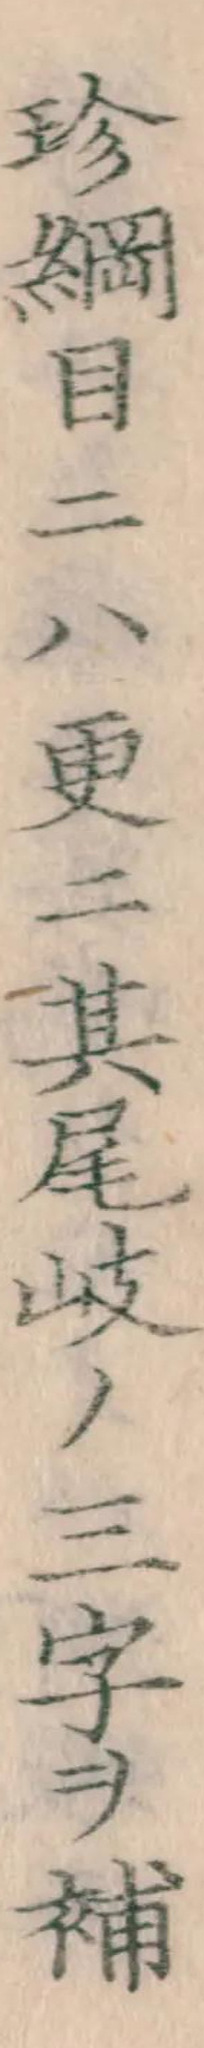珍綱目ニハ更ニ甚尾岐ノ三字ヲ補
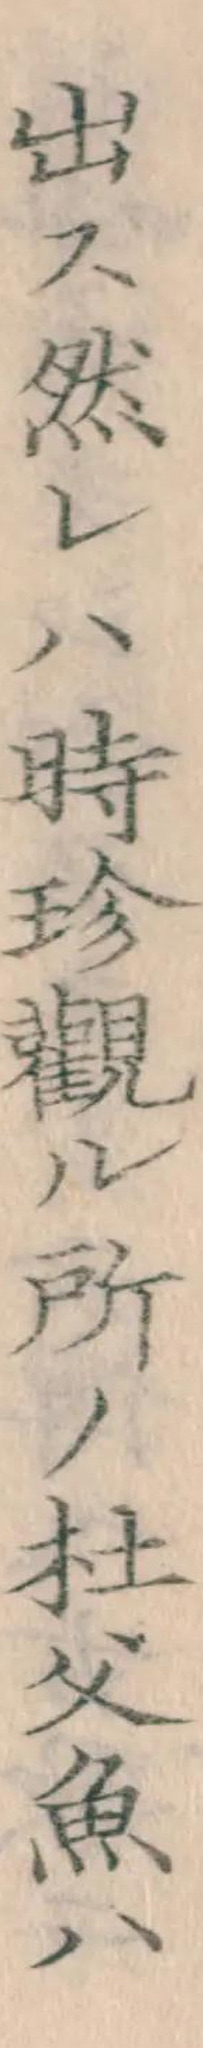出ス然レハ時珍観ル所ノ杜父魚ハ
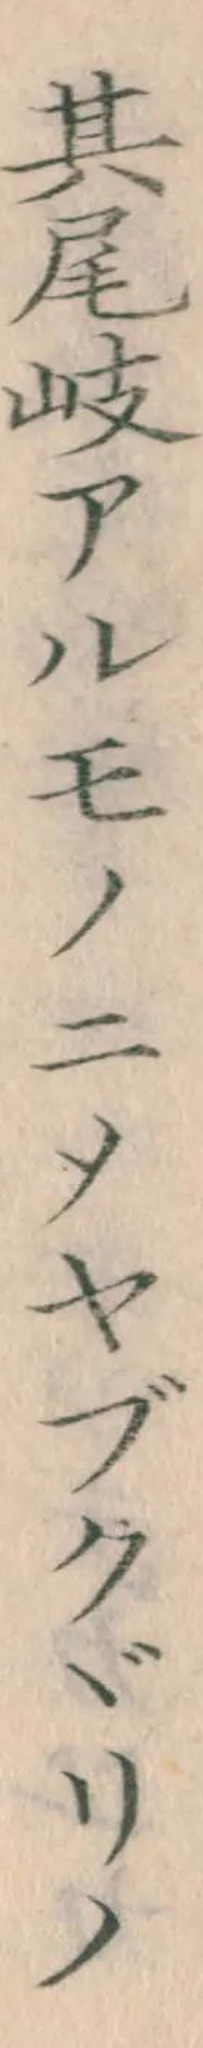其尾岐アルモノニシテヤブクヾリノ
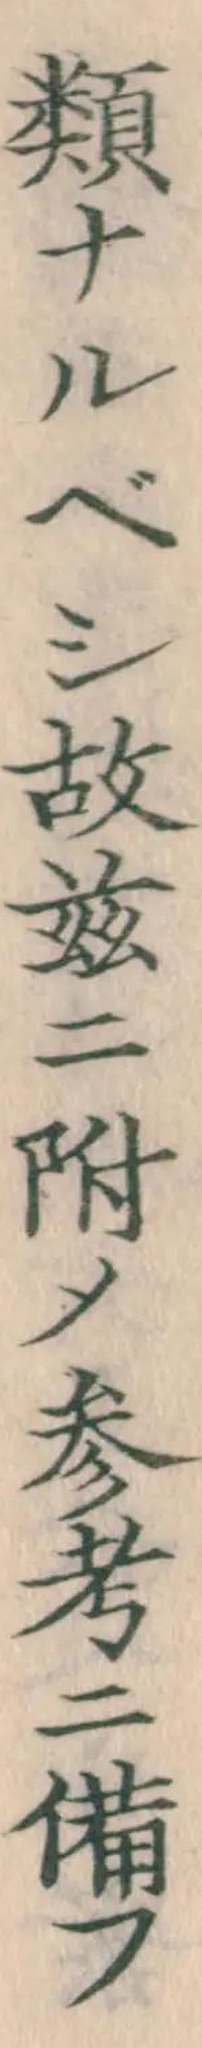類ナルベシ故茲ニ附シテ参考ニ備フ
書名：皇和魚譜 2巻
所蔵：国立国会図書館 National Diet Library, JAPAN
